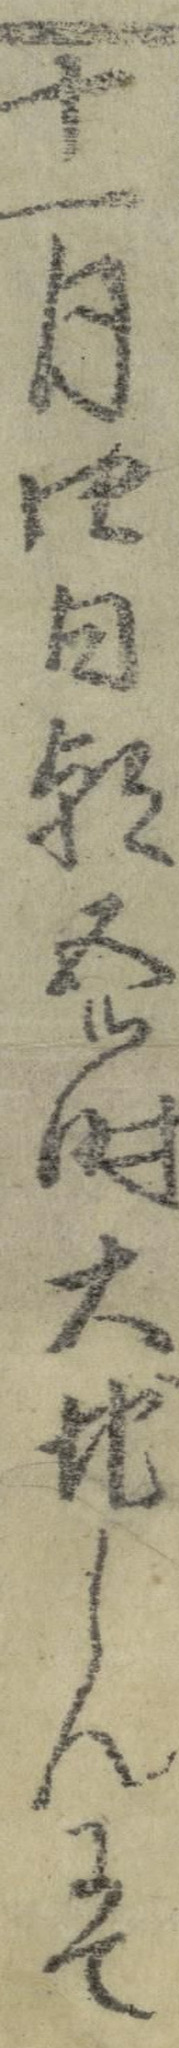十一月四日朝五ツ時大地しんにて
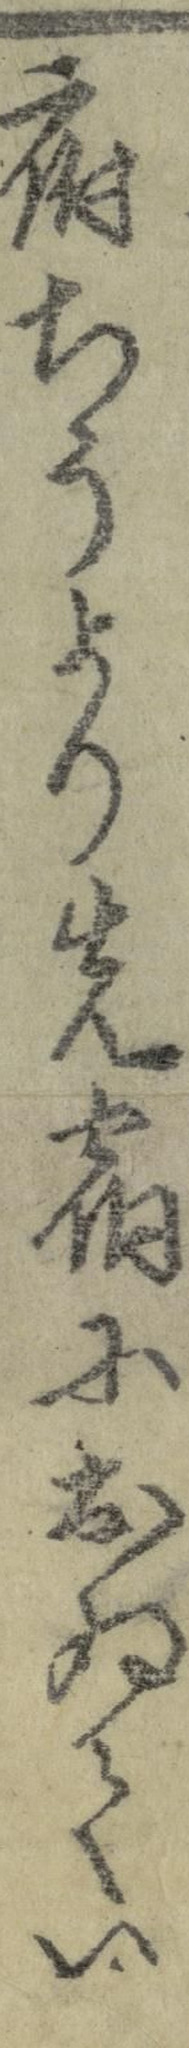府ちうより先宿におゐてい
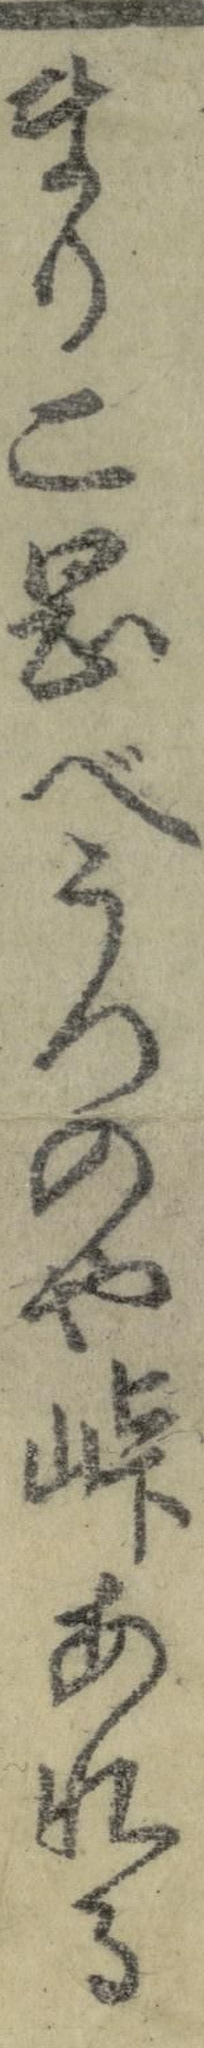まりこ岡べうつのや峠あれる
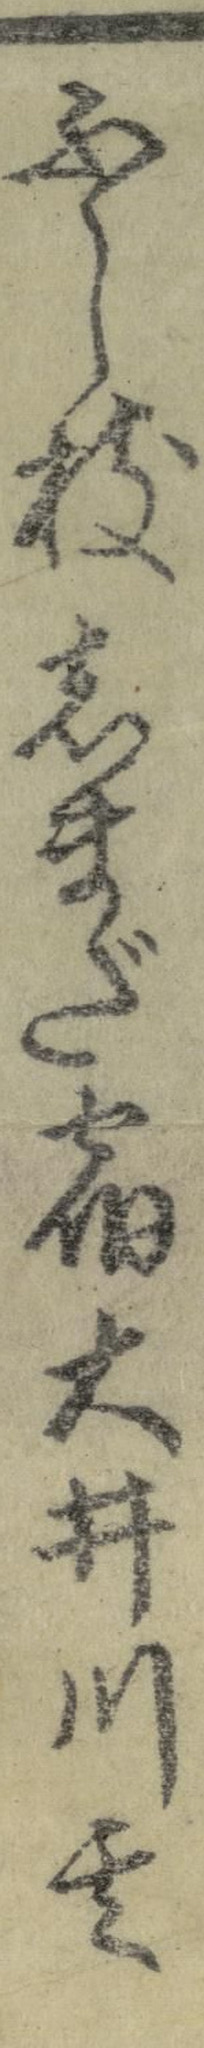ふし枝しまだ宿大井川其
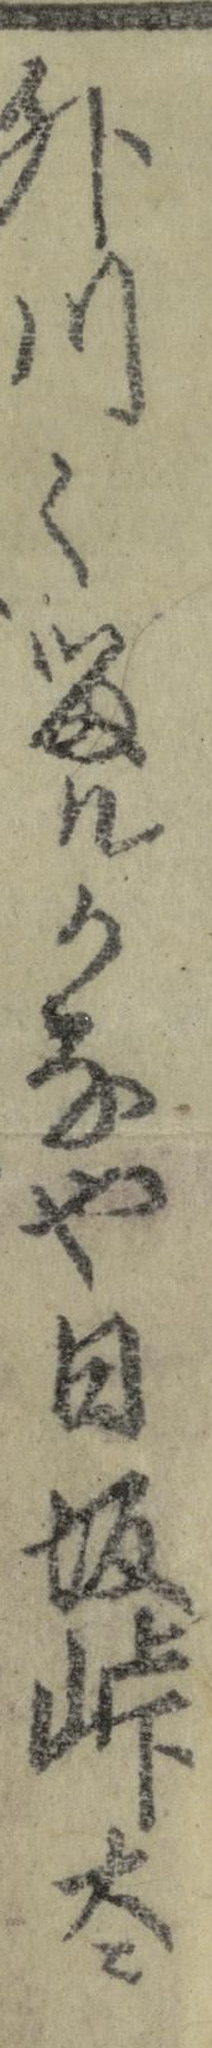外川々留るかなや日坂峠大に
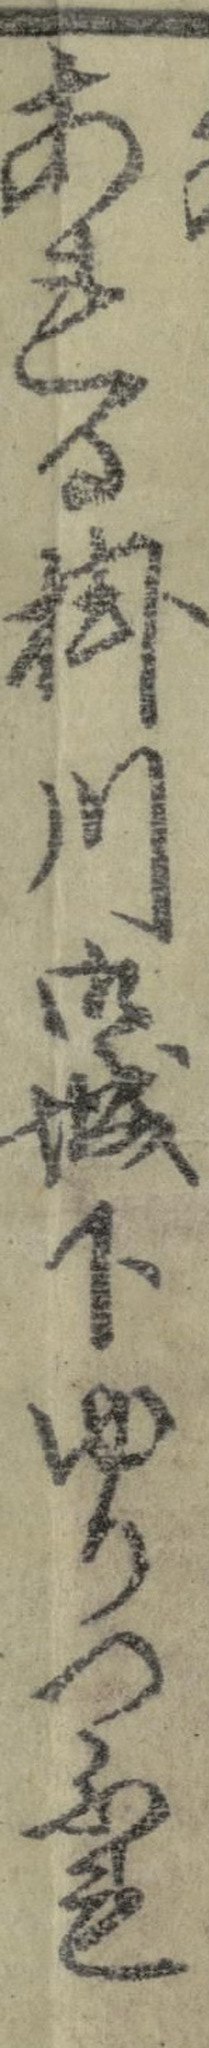あれる掛川御城下ゆりつふれ
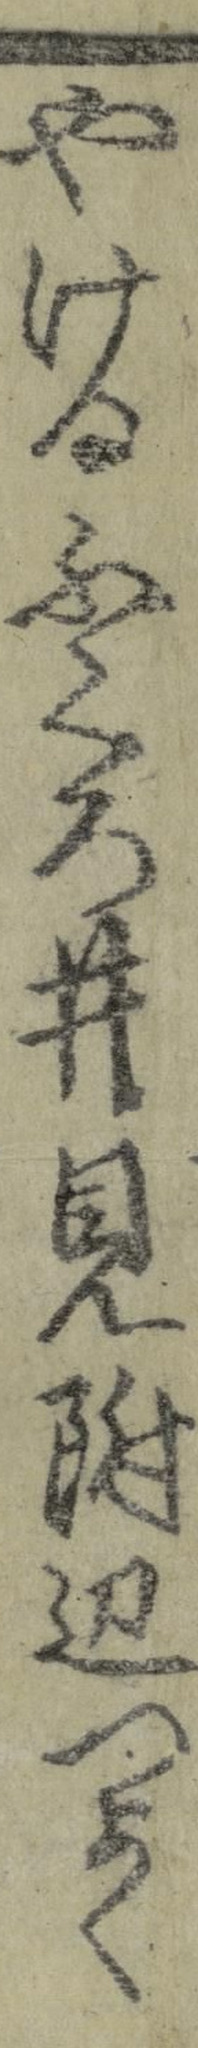やけるふくろ井見附辺つよく
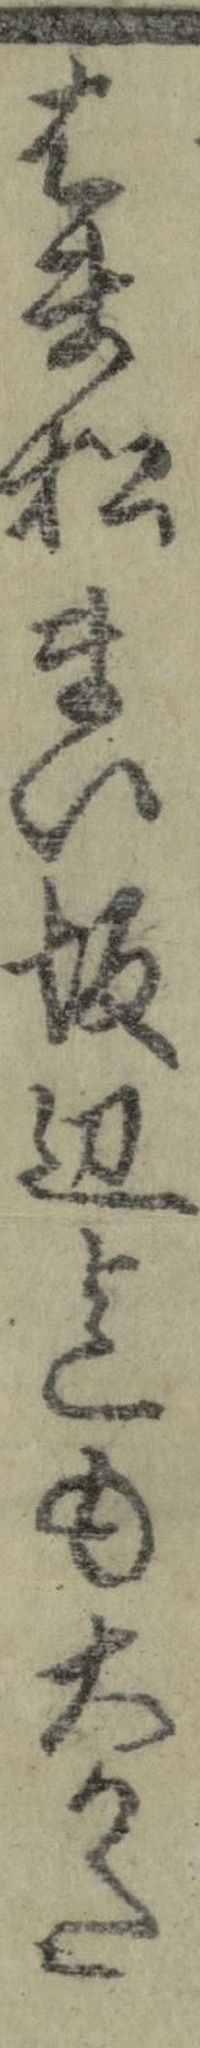はま松まい坂辺迄も大かた
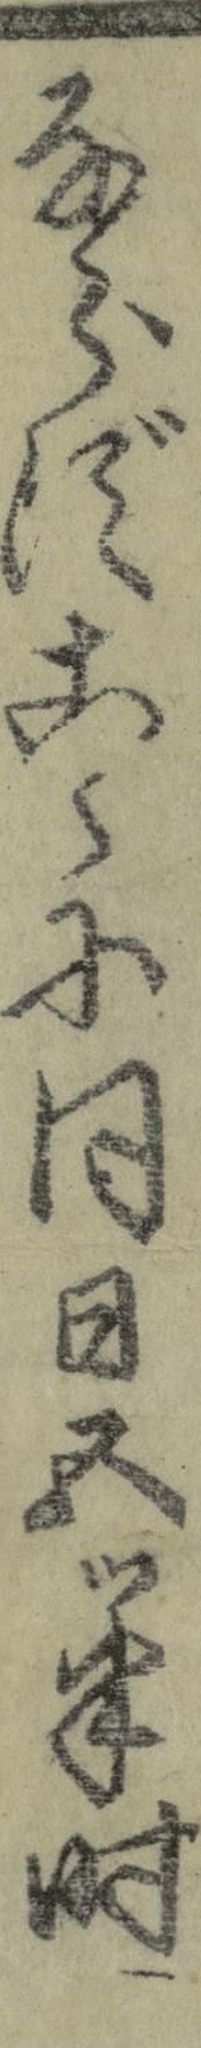ならずこゝに同日五ツ半時
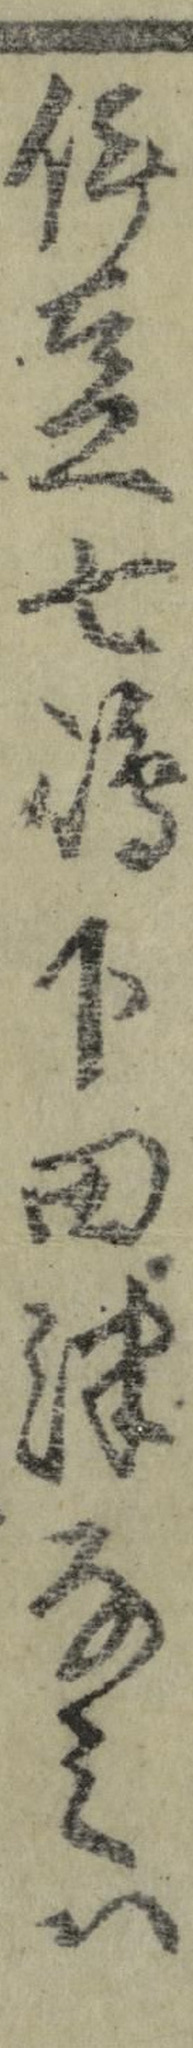伊豆七嶋下田津なみは
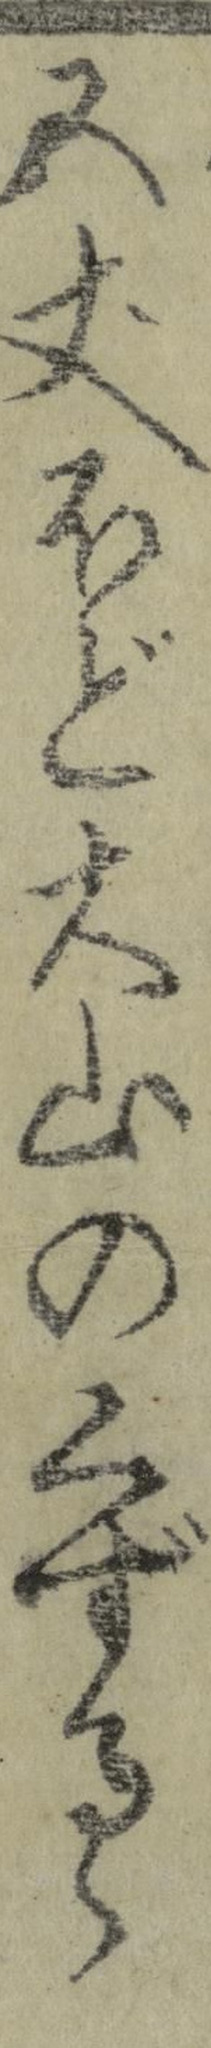五丈ほど大山のくずるゝ
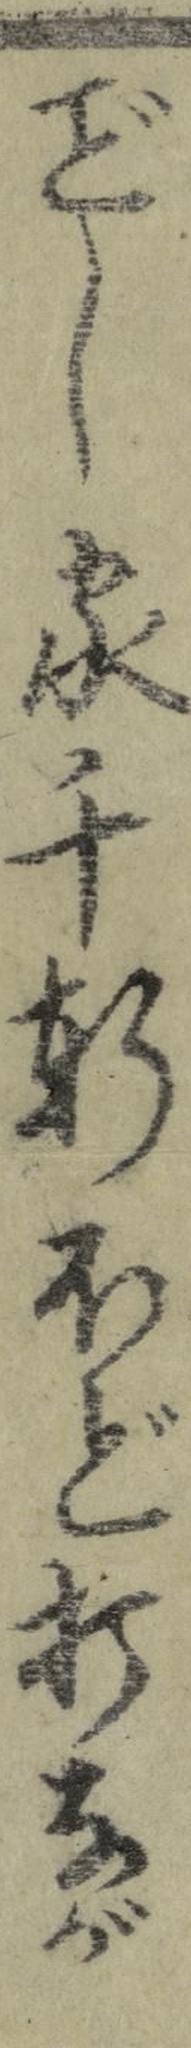ごとし家千軒ほど打なが
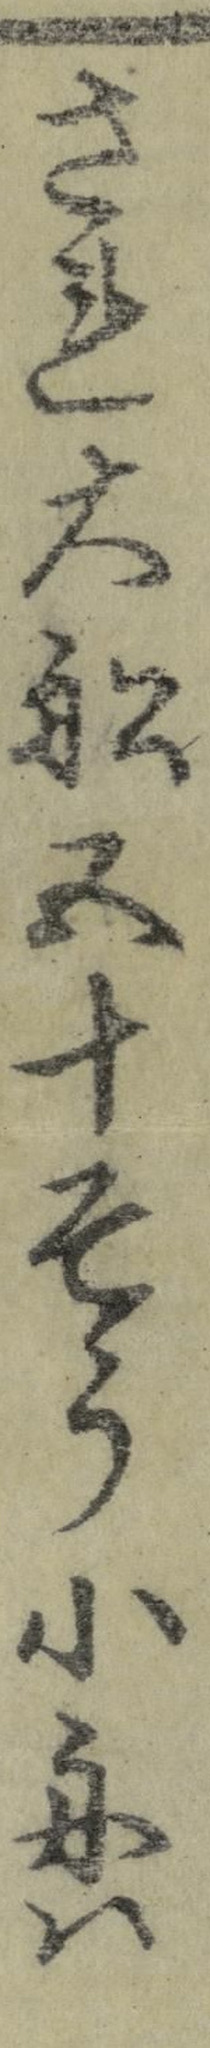され大舩五十そう小舟は
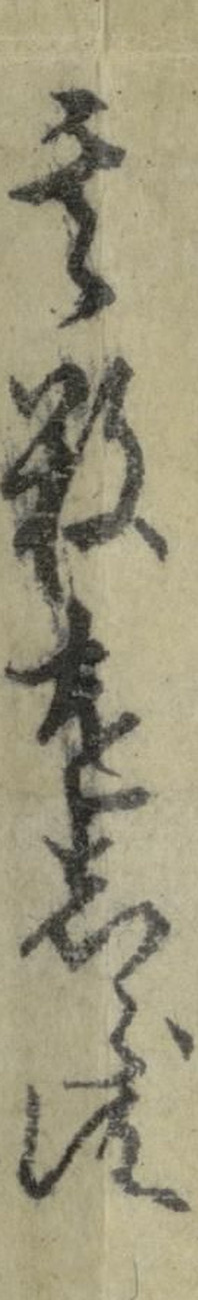其数をしらず
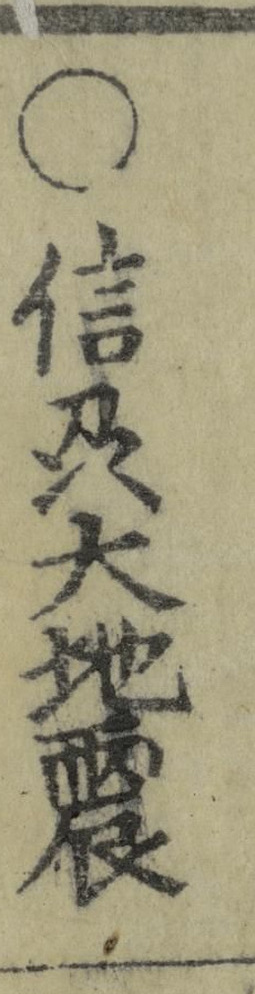○信州大地震
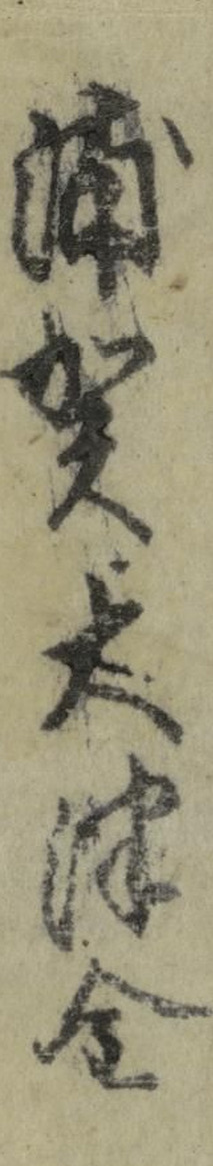浦賀大津金
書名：[安政東南海地震に関する瓦版]
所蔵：東京大学地震研究所図書室 Earthquake Research Institute Library, The University of Tokyo, JAPAN
